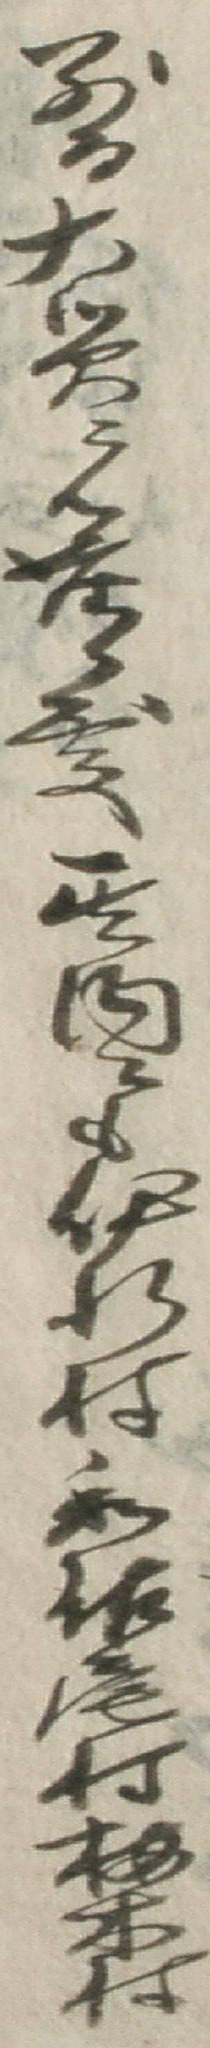別而大災二御座候処其内にも伊折村和佐尾村梅木村
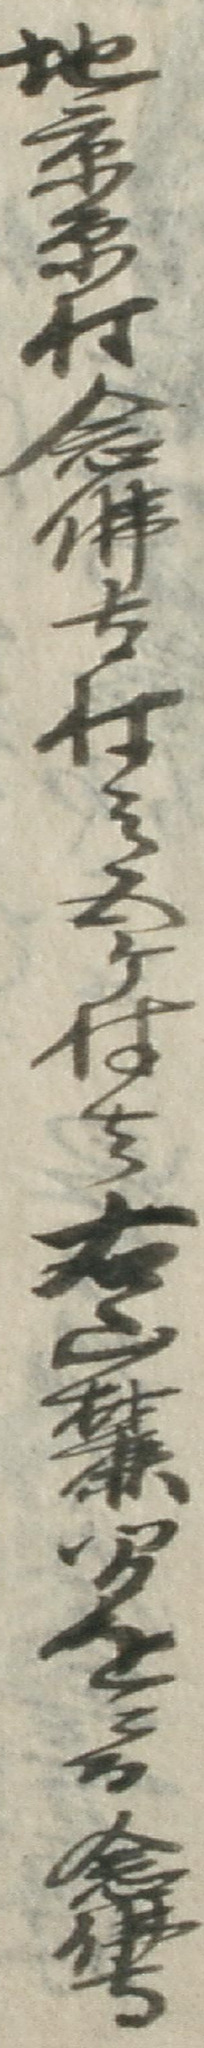地亰原村念仏寺村之五ヶ村ハ右山麓間近二而念仏寺
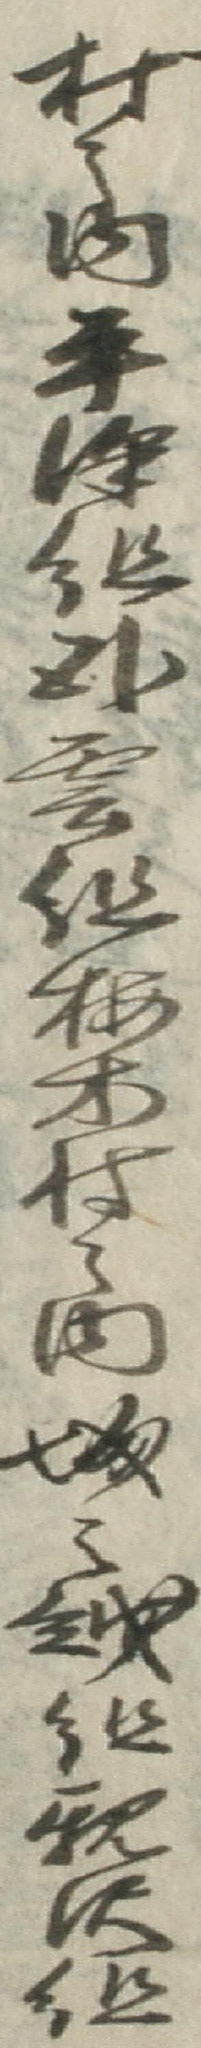村之内平沢組臥雲組梅木村之内城之越組親沢組
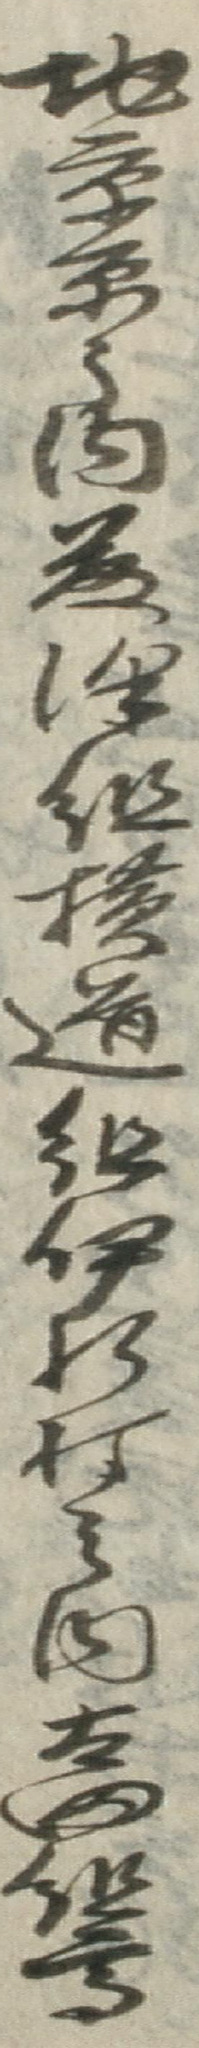地亰原村之内藤沢組横道組伊折村之内太田組高
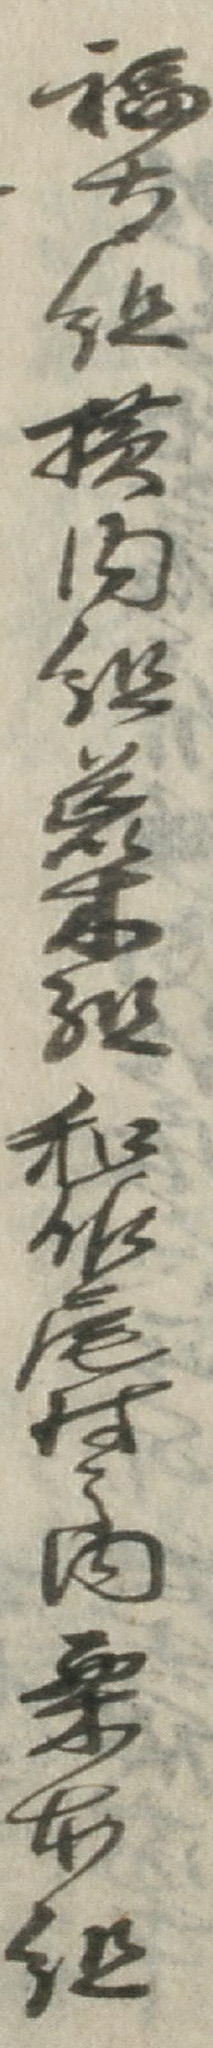福寺組横内組荒木組和佐尾村之内栗本組
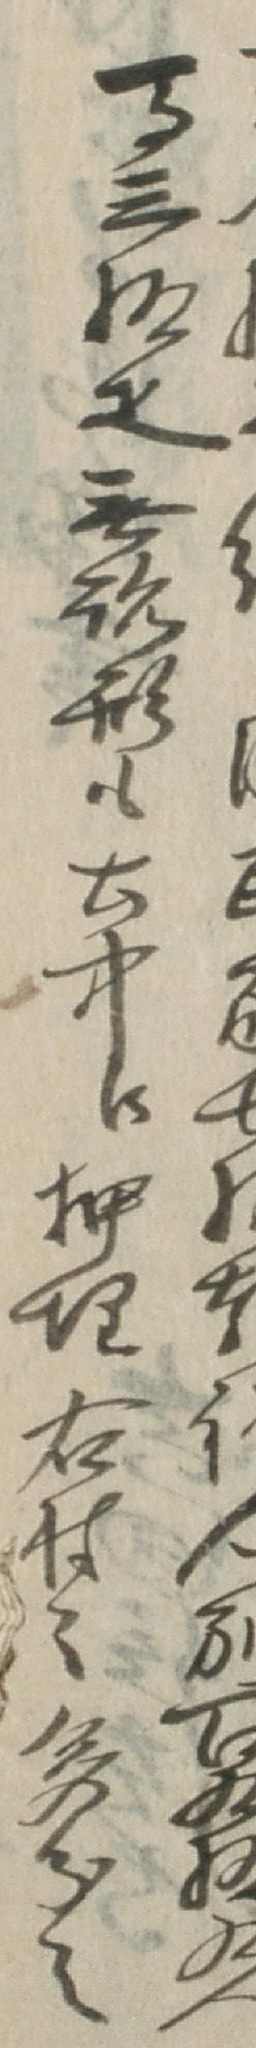馬三拾疋無跡形も土中ㇸ押埋右村々多分之
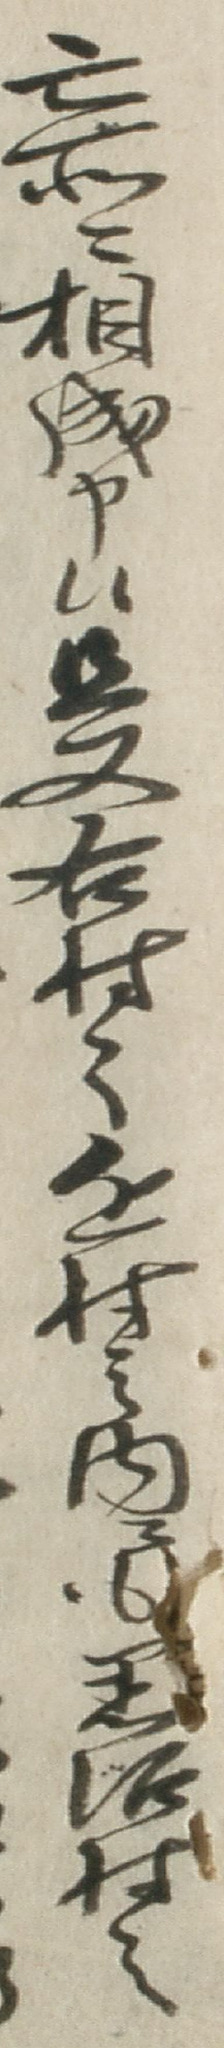亡所二相成申候且又右村々近村之内二も黒沼村之
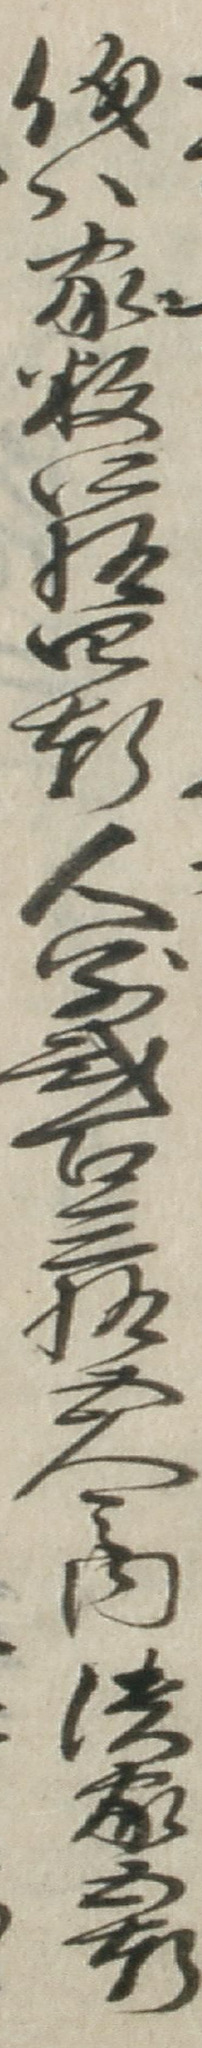儀ハ家数四拾四軒人数弐百三拾五人之内潰家五軒
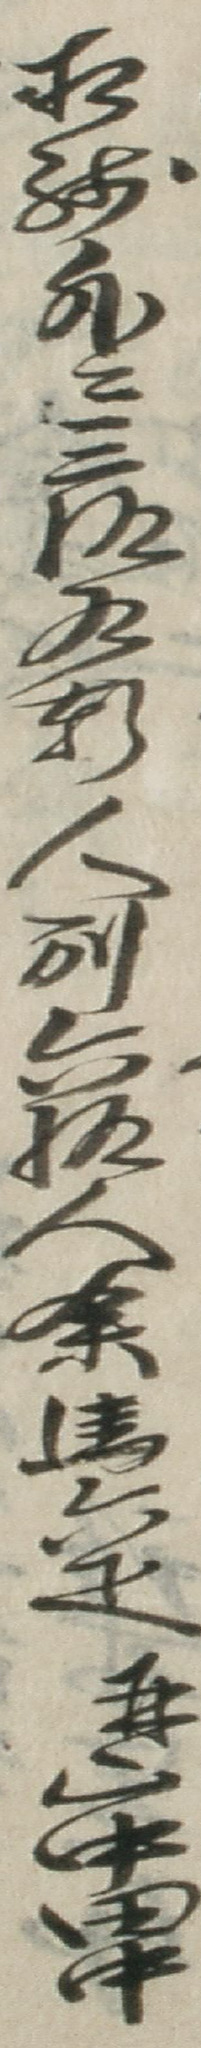相残外二三拾九軒人別六拾人余馬六疋并山中田中
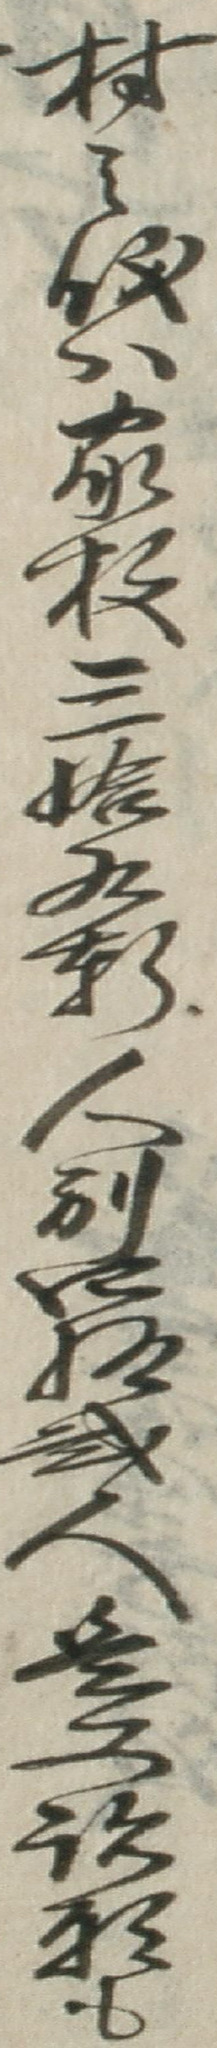村之儀ハ家数三拾九軒人別四拾弐人是又跡形も
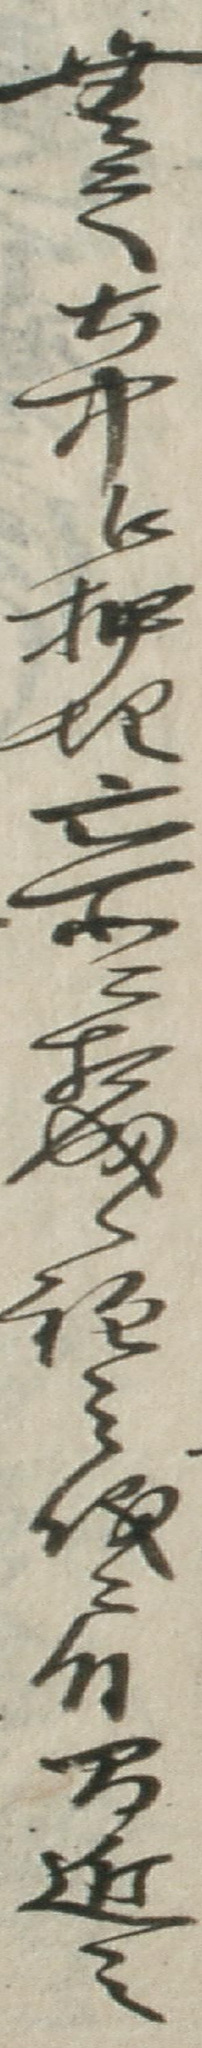無之土中江押埋亡所二相成候程之儀二付間近之
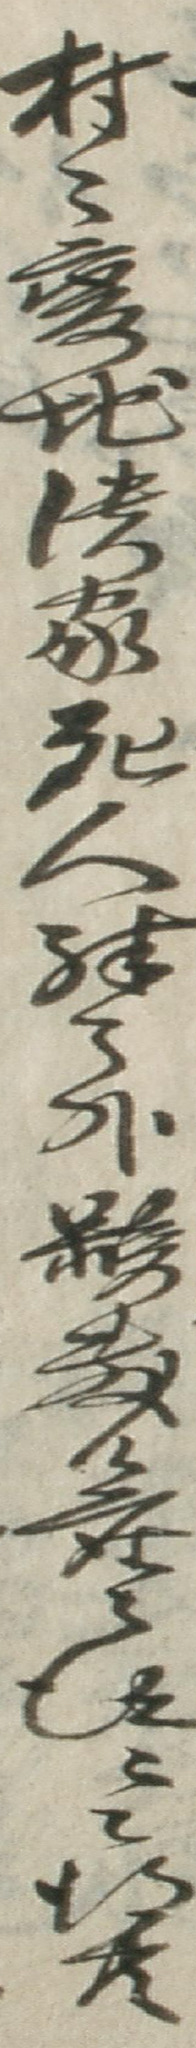村々変地潰家死人殊之外夥敷御座候趣二候得共
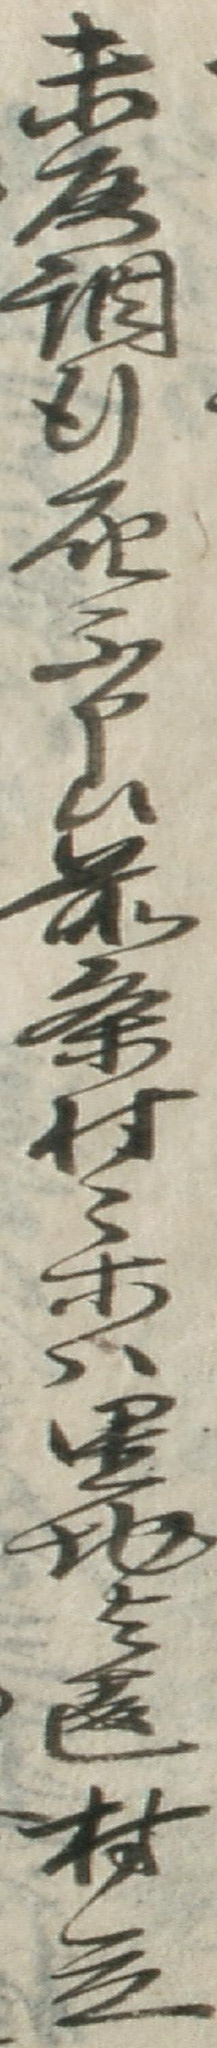未取調行届不申候前条村々等ハ里地と違村立
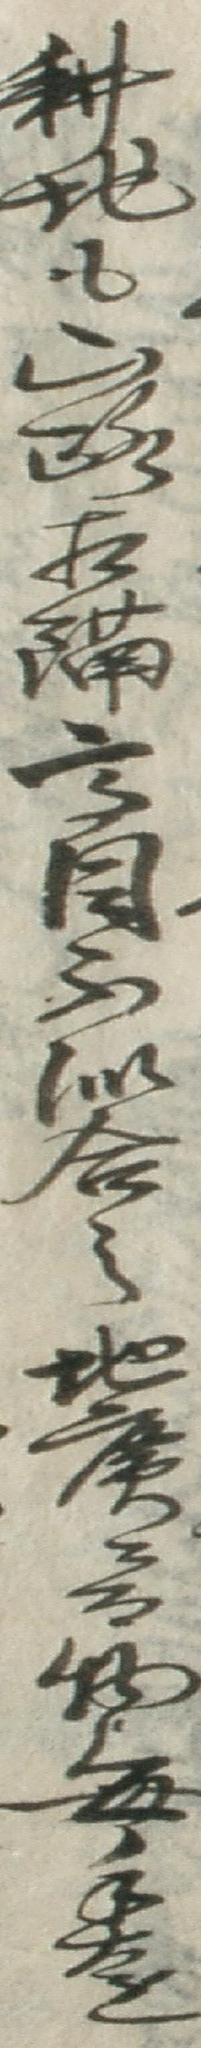耕地も山路相隔高目不似合地廣二而物事手遠
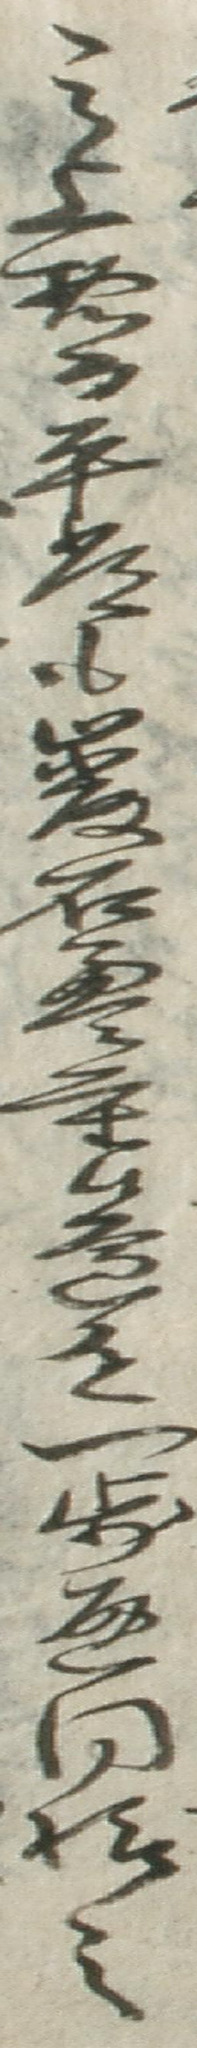之上惣而平常も厳石畳重候辺を一歩通同様之
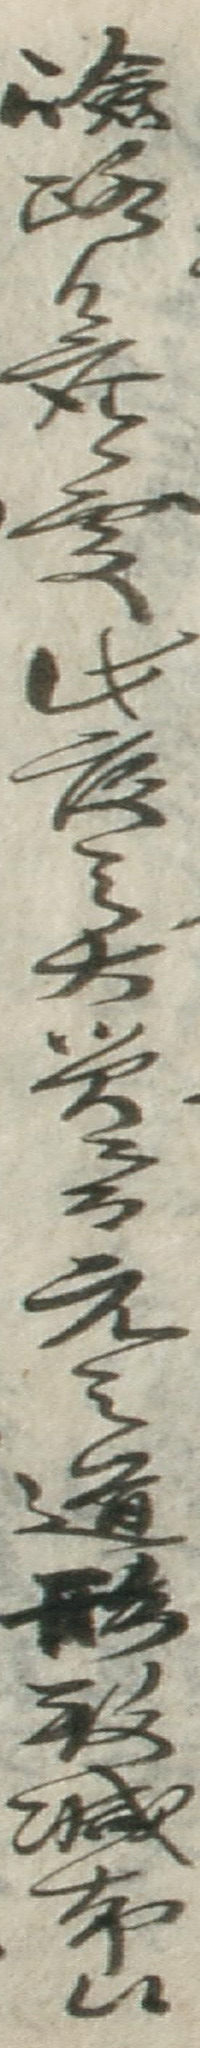険路御座候処此度之大災二而元之道形致滅却候
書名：信濃國地震實録記
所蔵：東京大学地震研究所図書室 Earthquake Research Institute Library, The University of Tokyo, JAPAN
